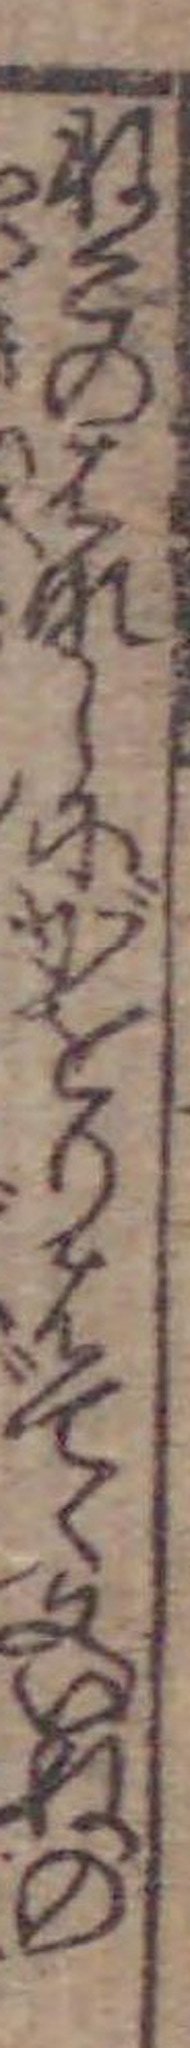ねこのはなしにがをりはてゝ又いぬの
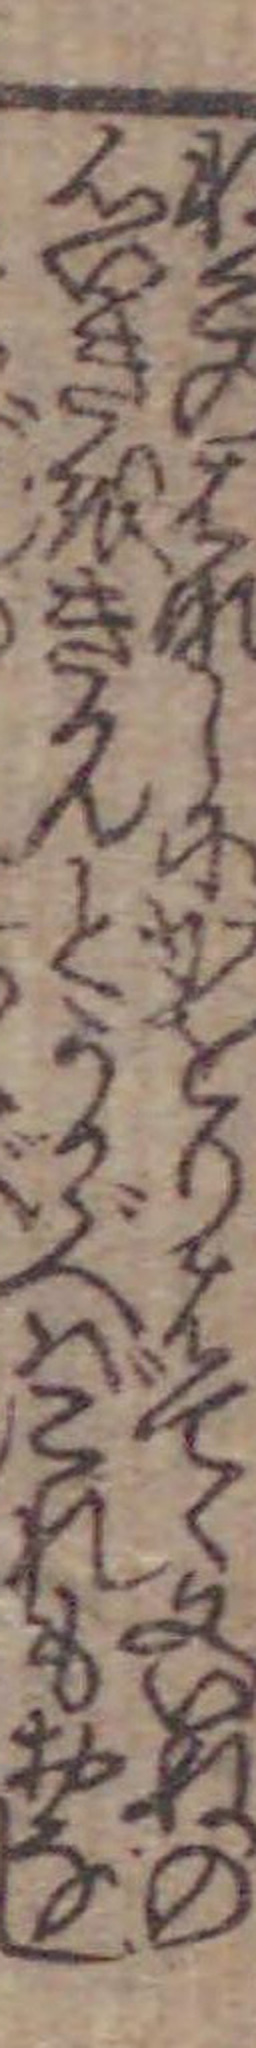心いきをきかんとうかゞへばこれもおなし
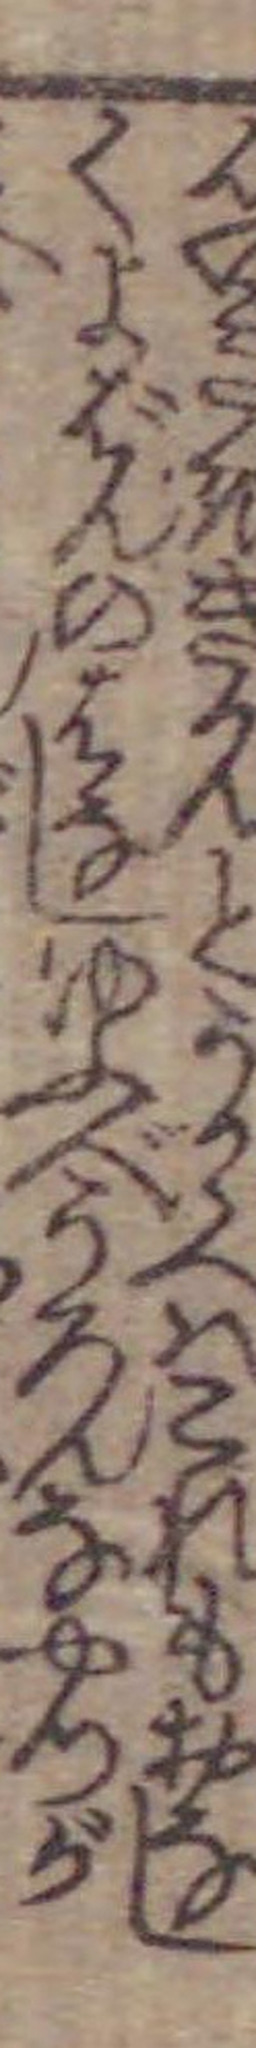くよばんのはなしゆふべうろんなやつが
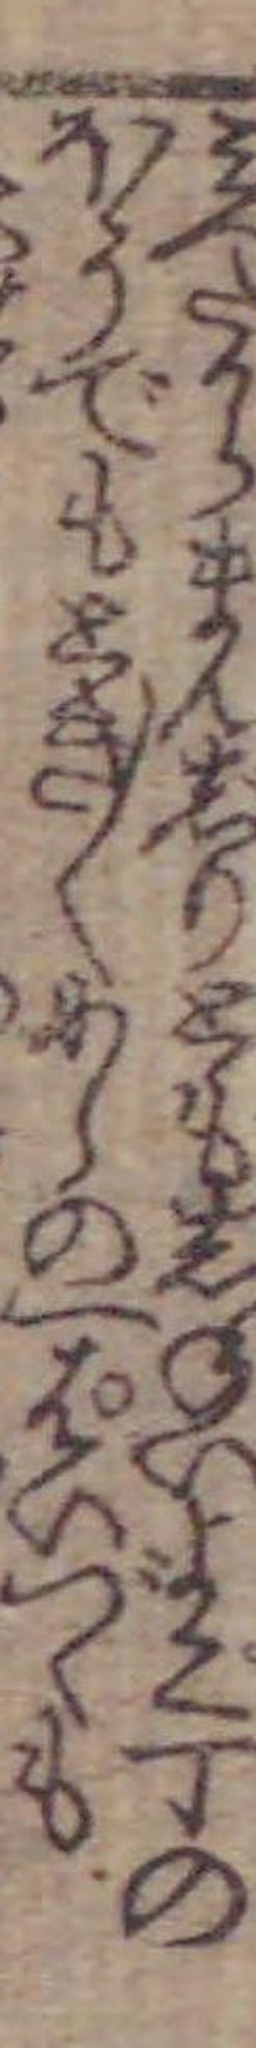ほうでもとき〳〵めしの一ぱいづゝも
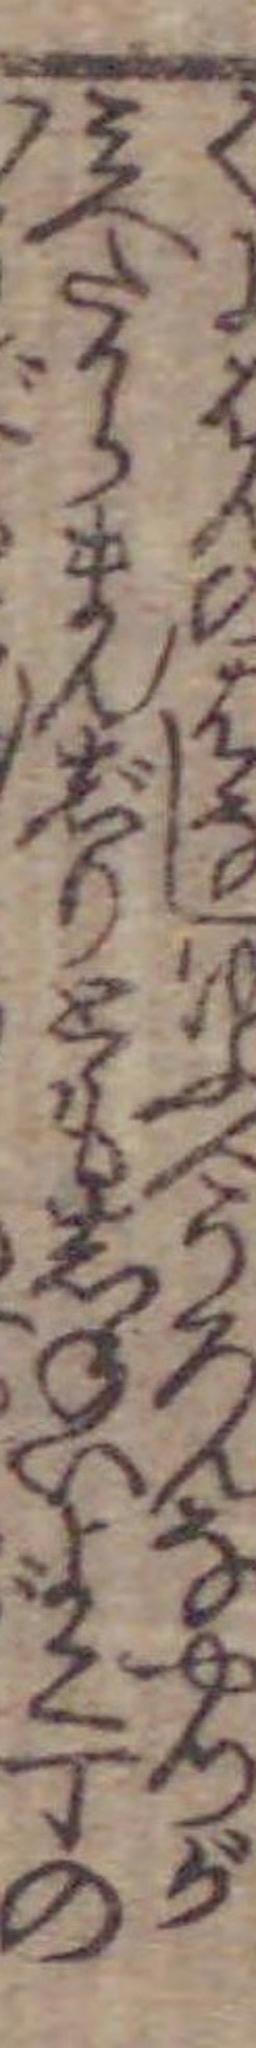みへたからまんじりともしねいよこ丁の
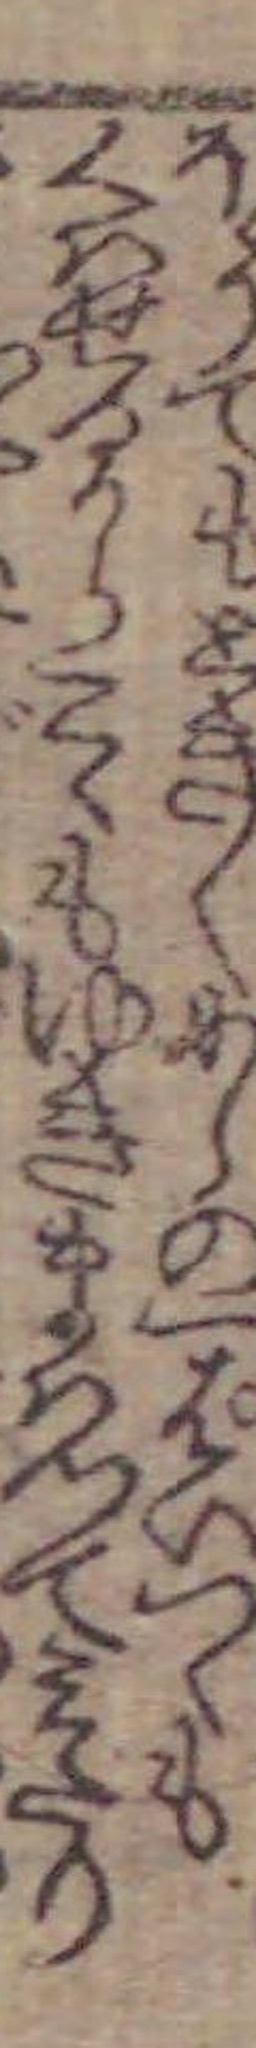くはせるからこゝもゆきまはつてみたり
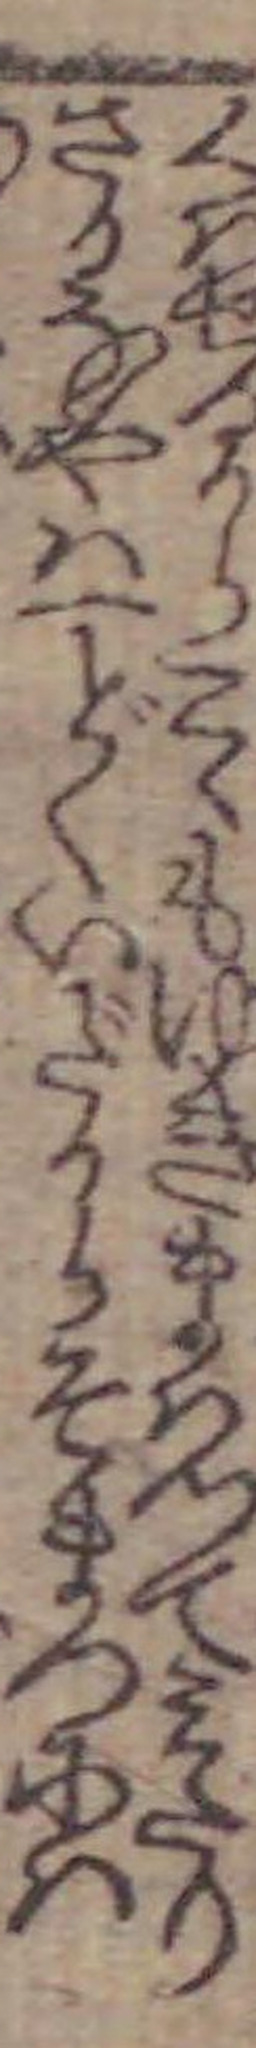さかなやは一どくいだからそまつには
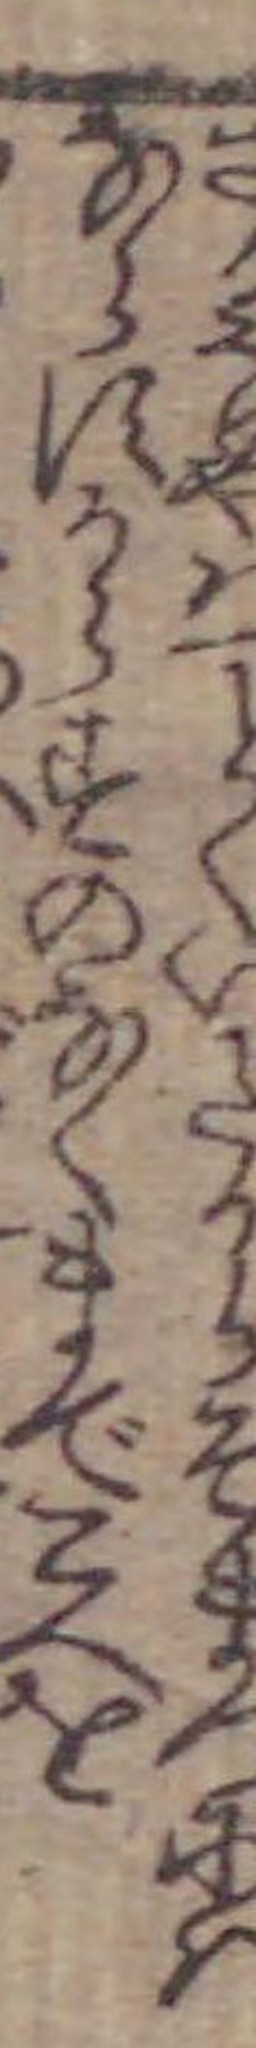ならすからすのなくまでこへを
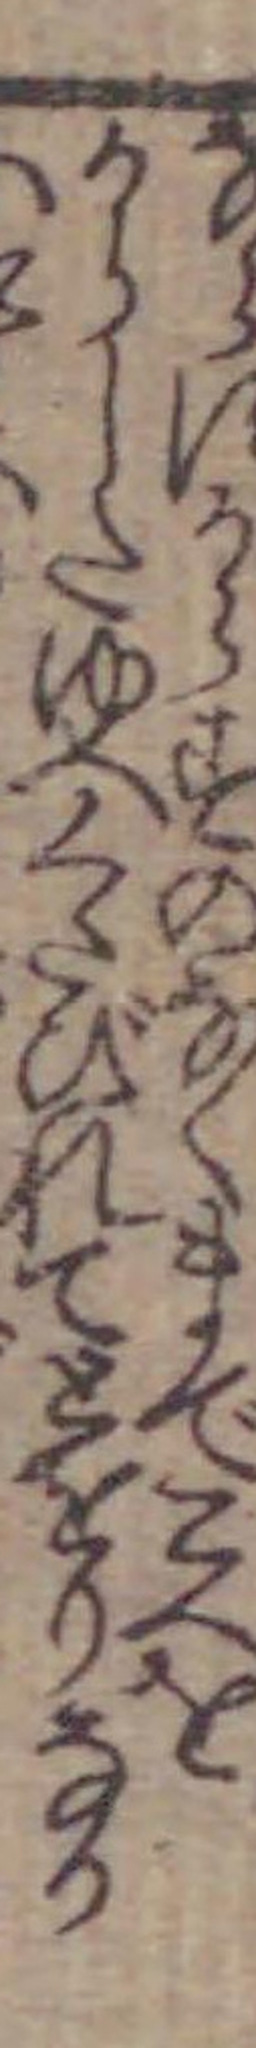からしたゆへくたびれてとをりなか
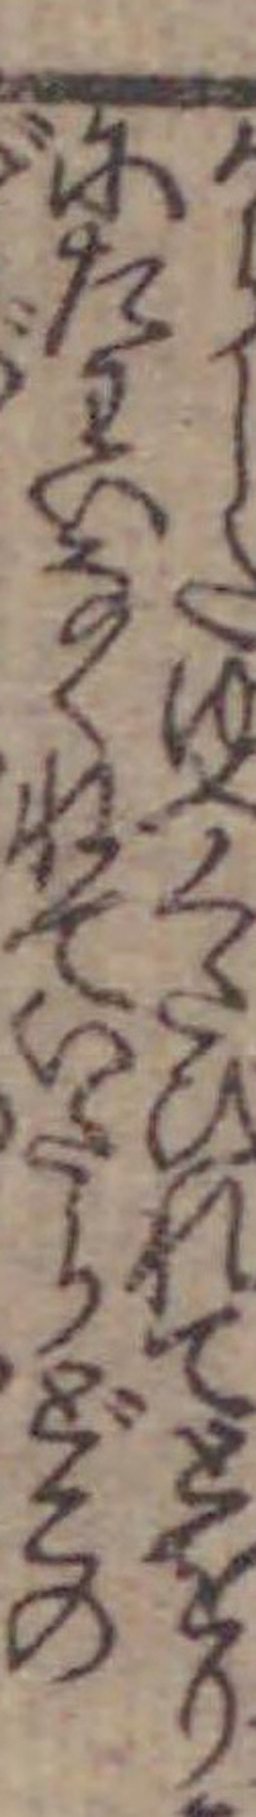にたわいなくねていたらどこの
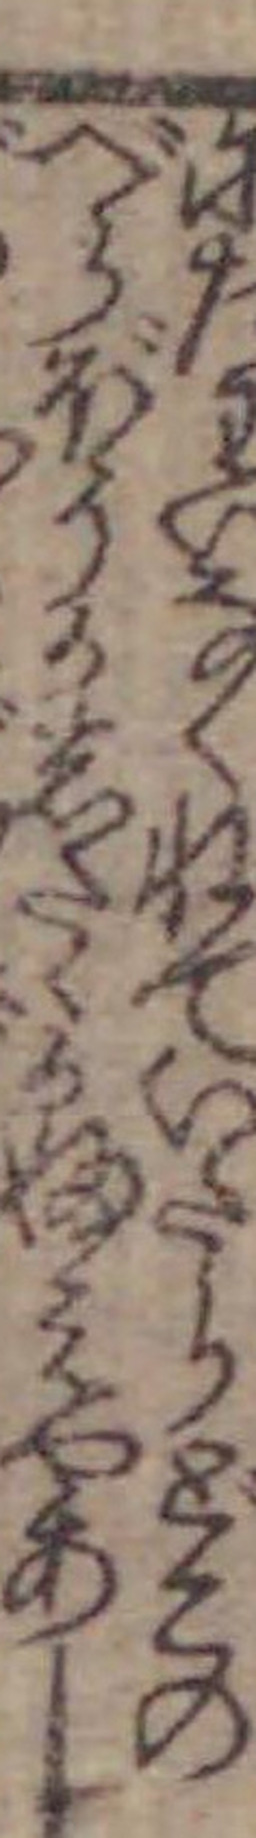べらぼうかしたゝかふみやあ
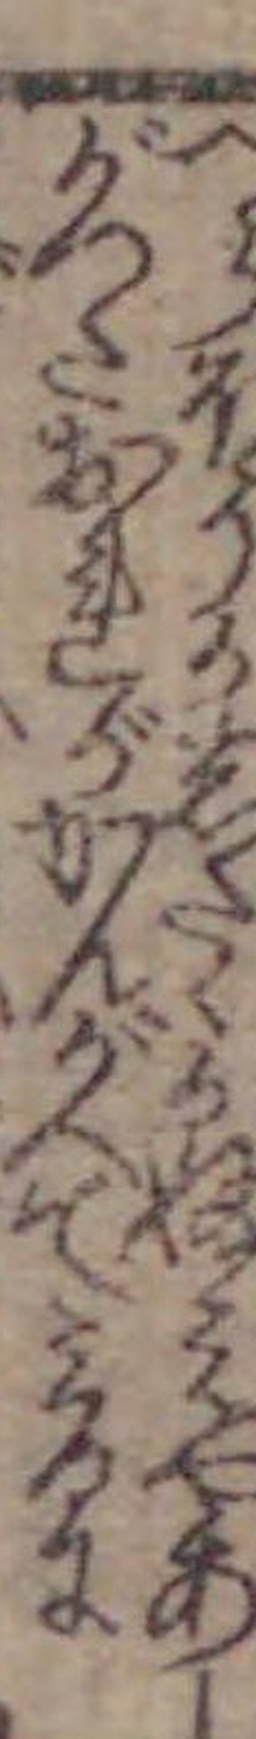がつたおれがかんがへてみるに
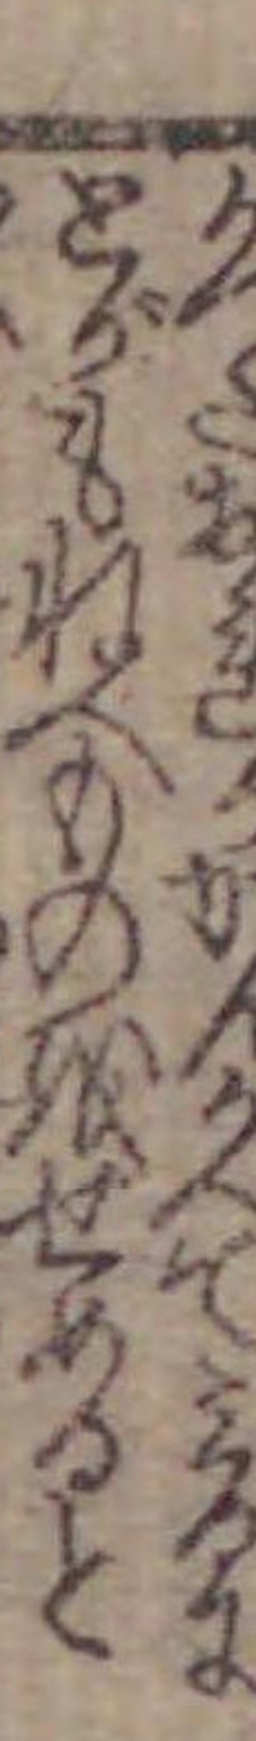とがもねへものをせめると
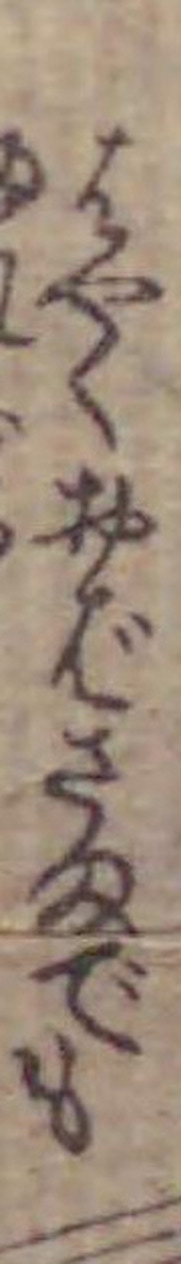はやくおばさまでも
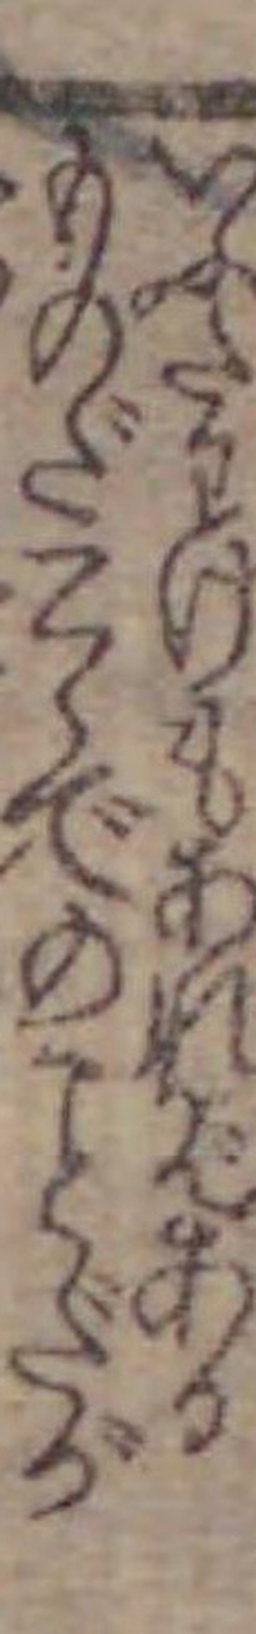ものだこゝでのことだが
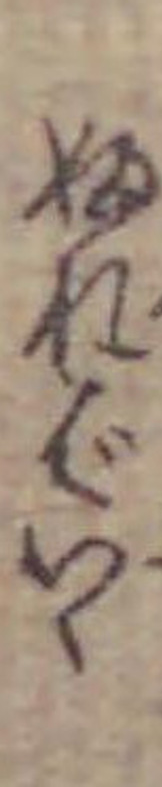ふればいゝ
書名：即席耳学問 : 3巻
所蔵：国立国会図書館 National Diet Library, JAPAN
